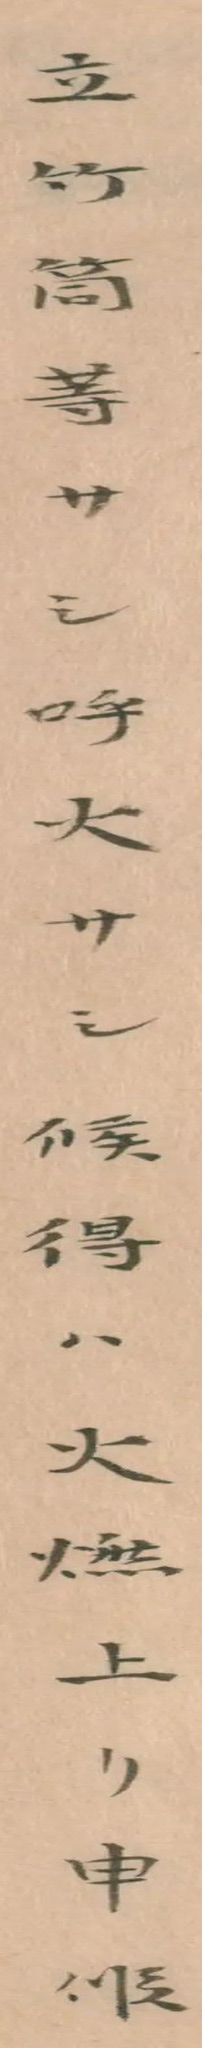立竹筒等サシ呼火サシ候得ハ火燃上り申候
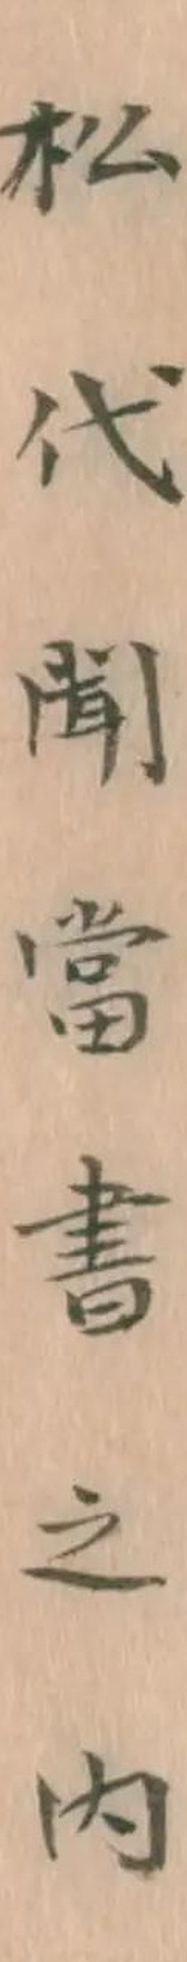松代聞当書之内
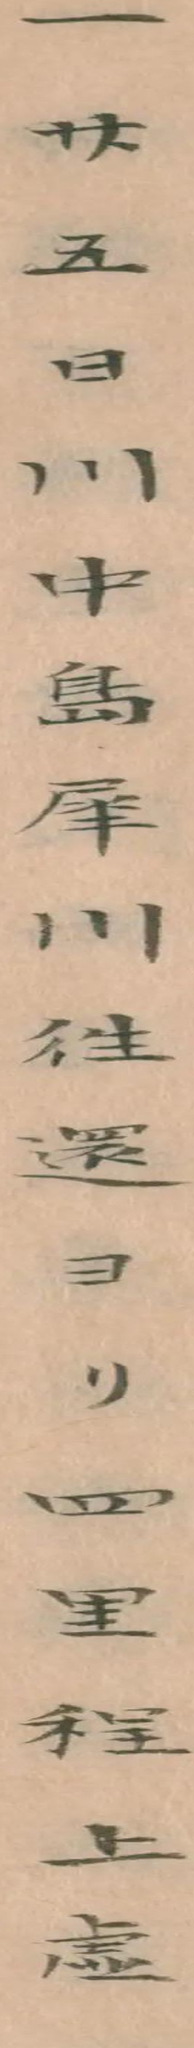一廿五日川中島犀川往還ヨリ四里程上虚
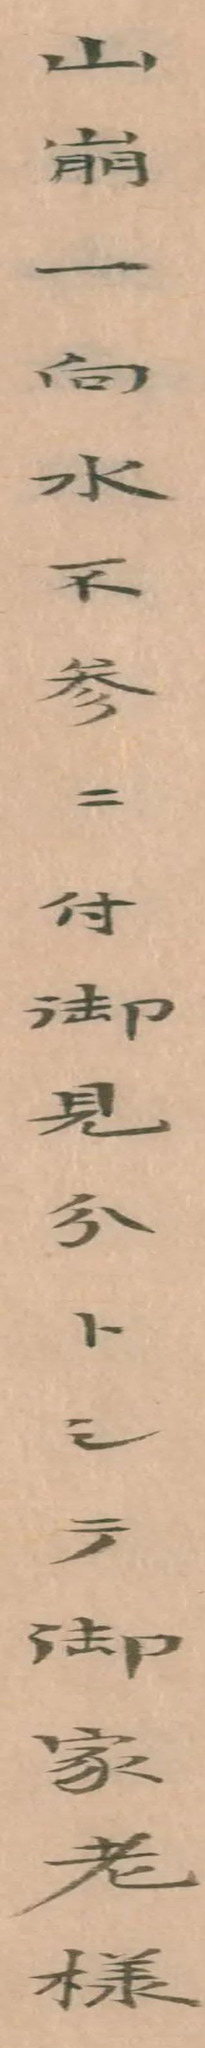山崩一向水不参二付御見分トシテ御家老様
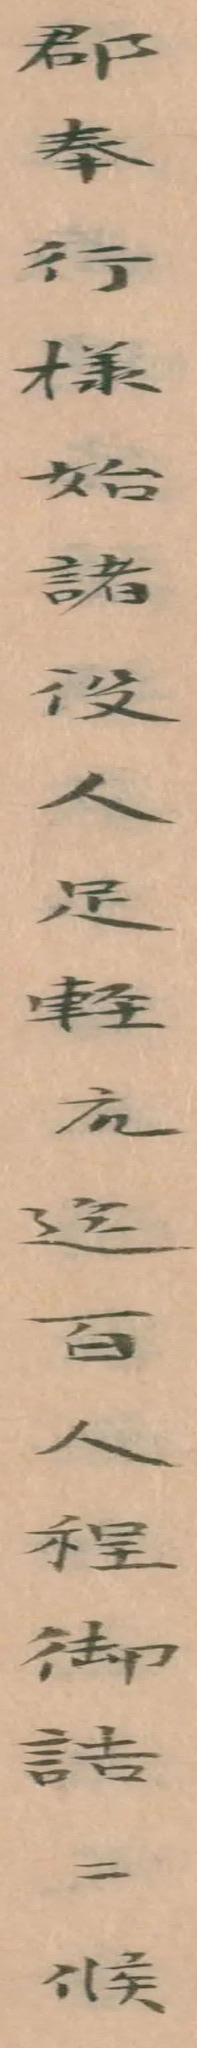郡奉行様始諸役人足軽衆迄百人程御詰二候
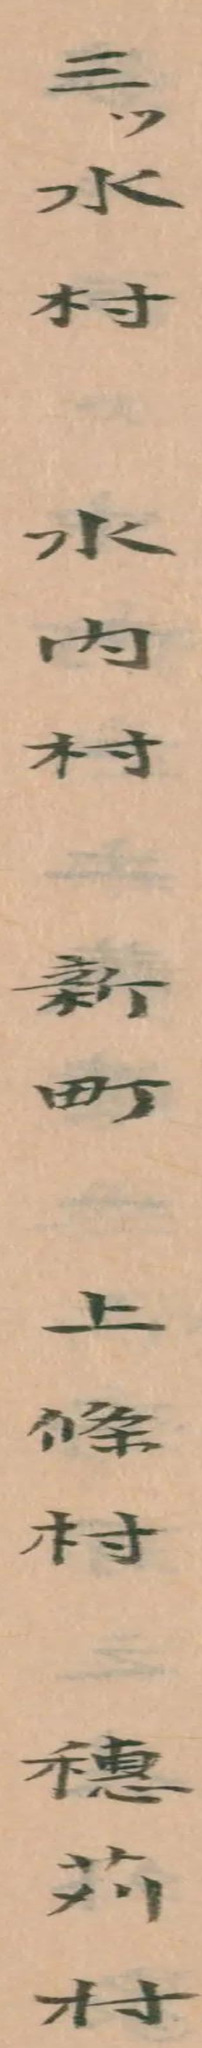三ッ水村水内村新町村上條村穂刈村
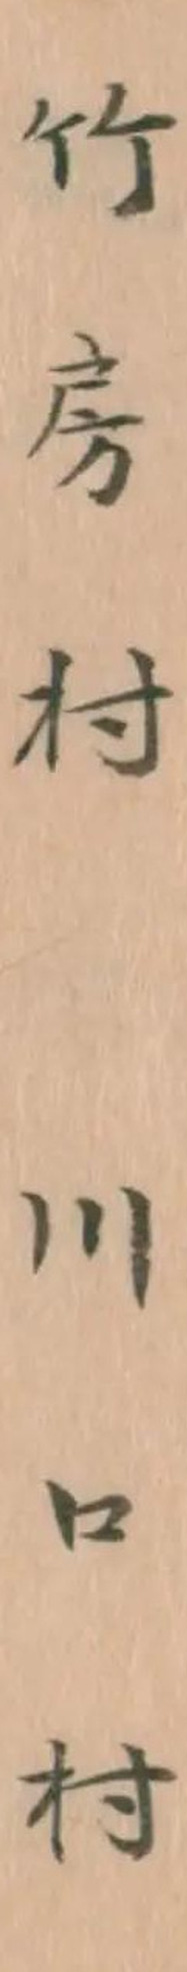竹房村川口村
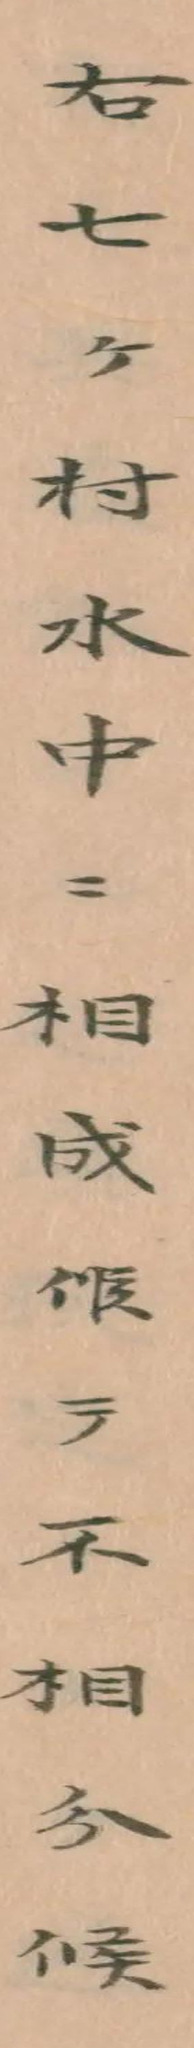右七ヶ村水中二相成候テ不相分候
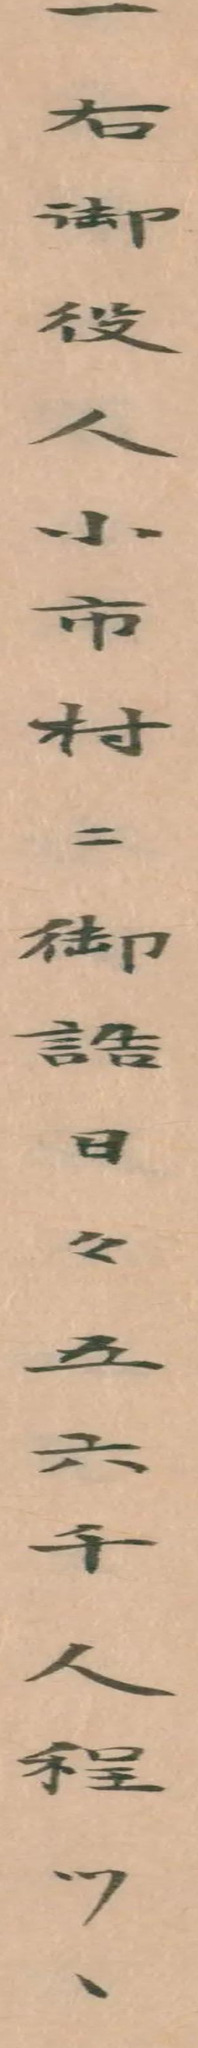一右御役人小市村二御詰日々五六千人程ツゝ
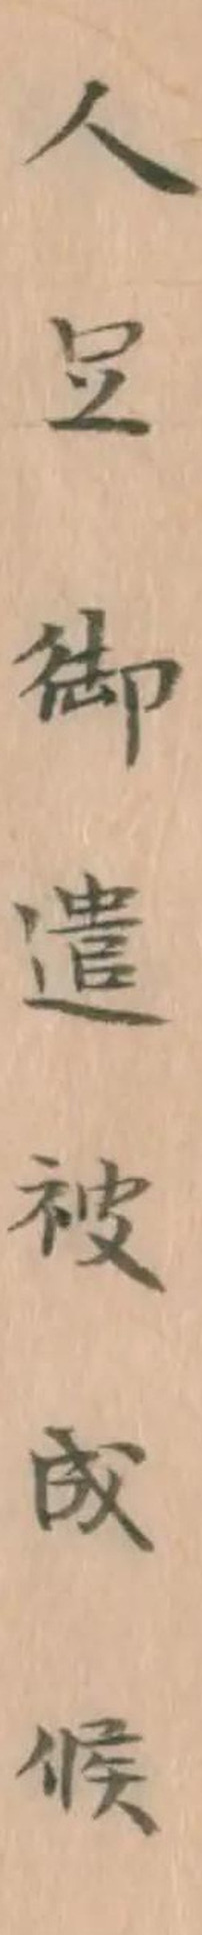人足御遣被成候
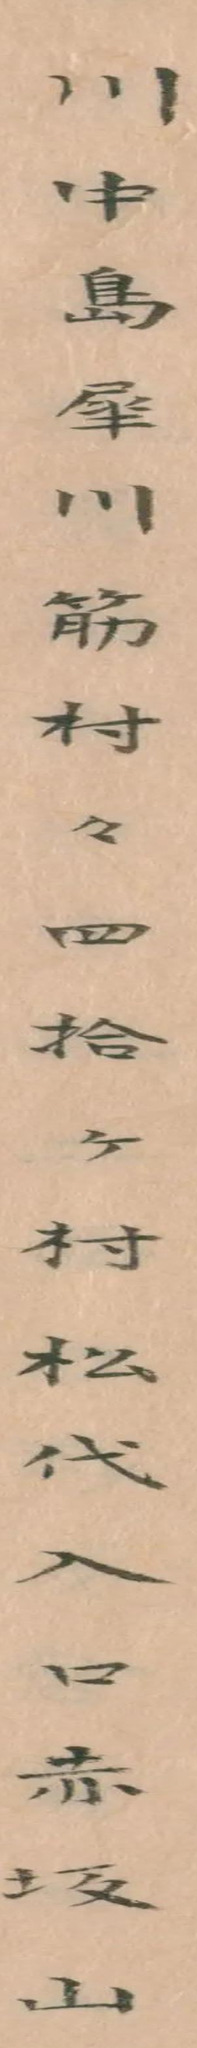一川中島犀川筋村々四拾ヶ村松代入口赤坂山
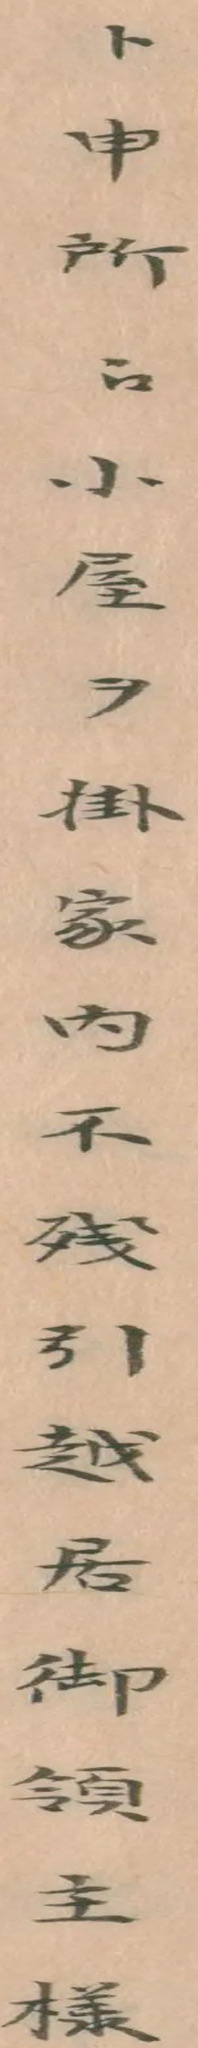ト申所江小屋ヲ掛家内不残引越居御領主様
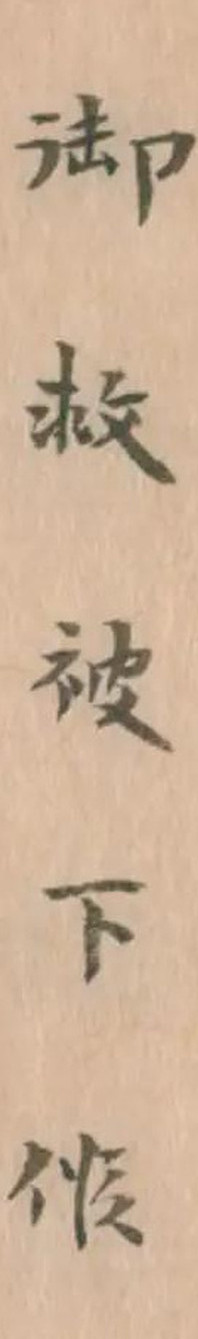御赦被下候
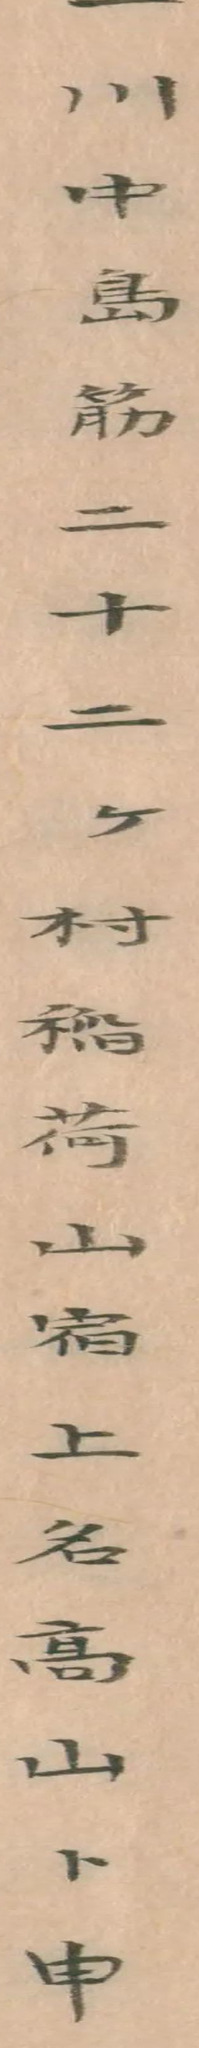一川中島筋二十二ヶ村稲荷山宿上名高山ト申
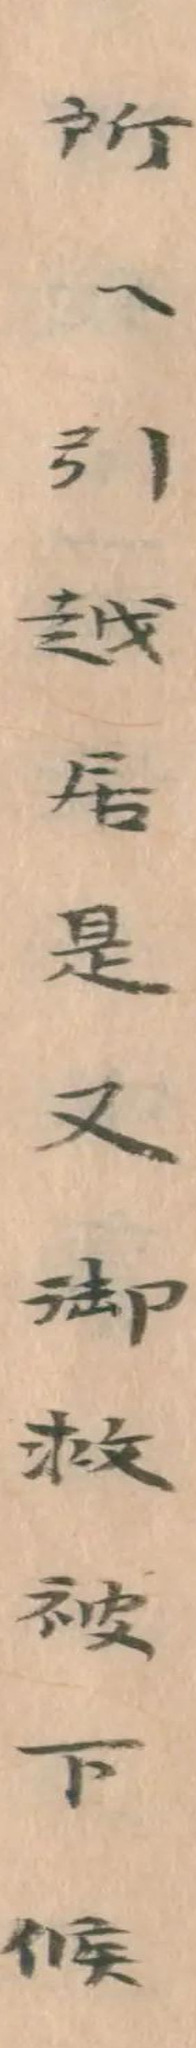所へ引越居是又御赦被下候
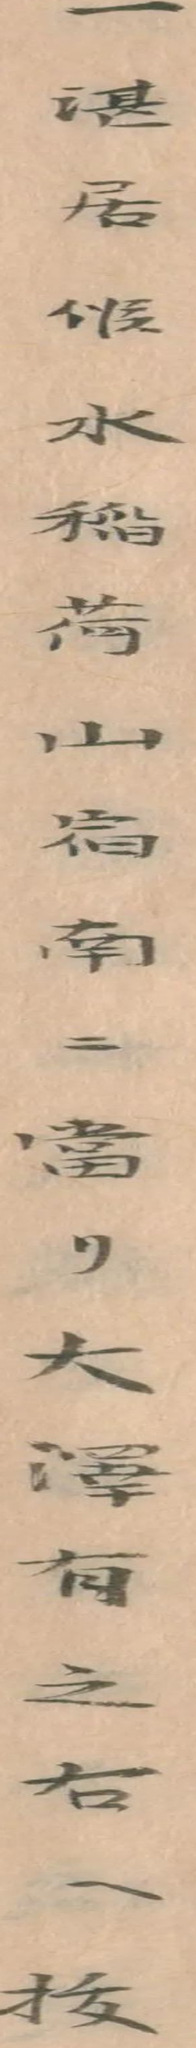一湛居候水稲荷山宿南二当り大沢有之右へ抜
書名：地災撮要. 巻1(噴火山・地震ノ部)
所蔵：国立国会図書館 National Diet Library, JAPAN
